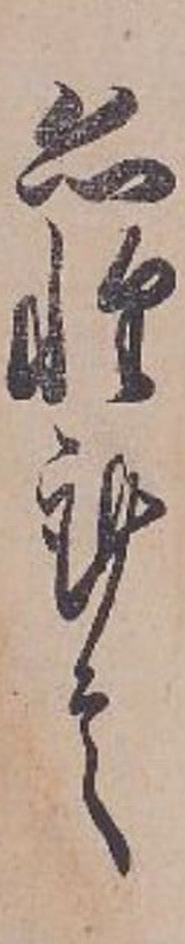恐惶謹言

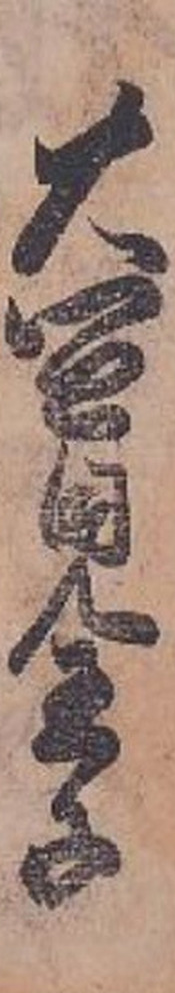大宜見王子
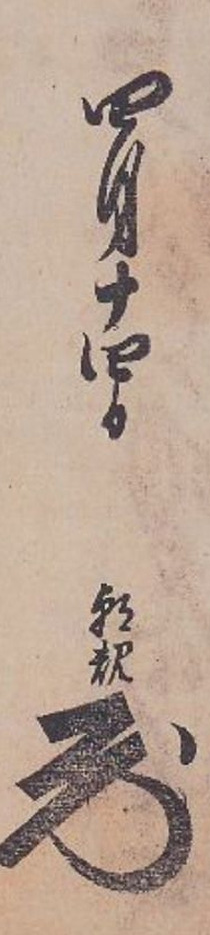四月十四日朝規花押
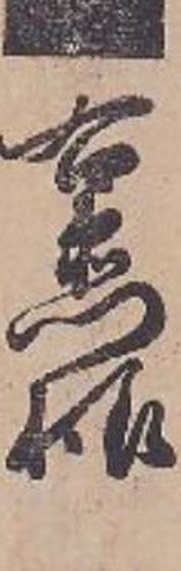右衛門様
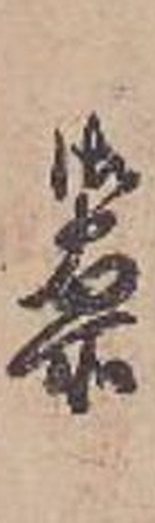御宿所
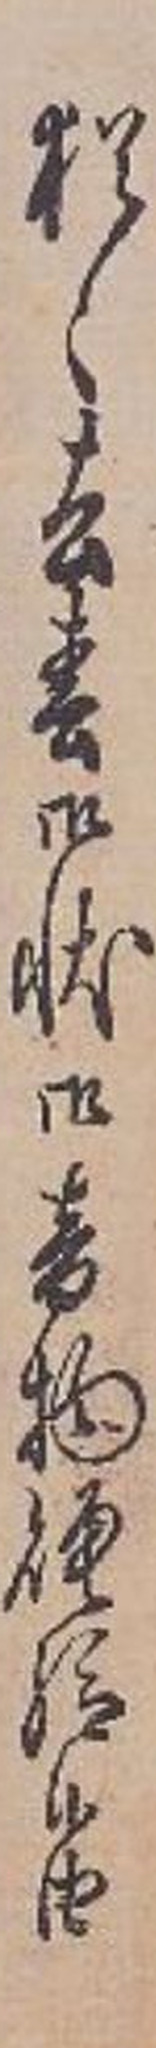猶々去春御状御音物贈給候由
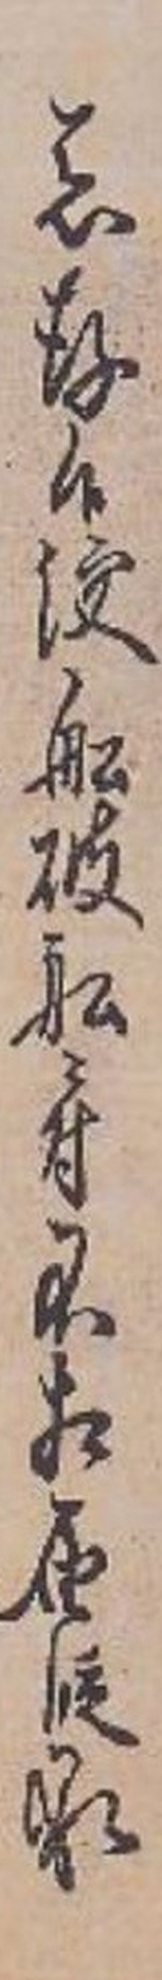忝存候便船破船に付不相届段承
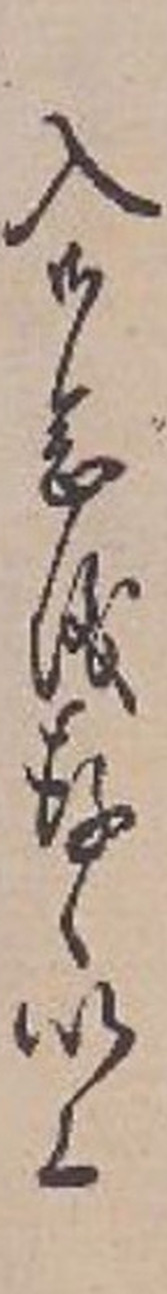入御念儀存候以上
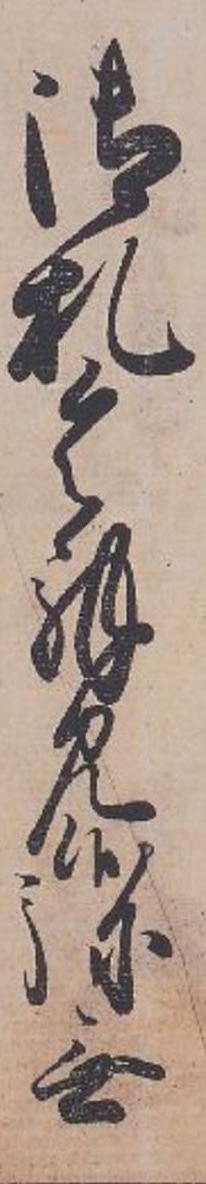御札令拝見候弥無
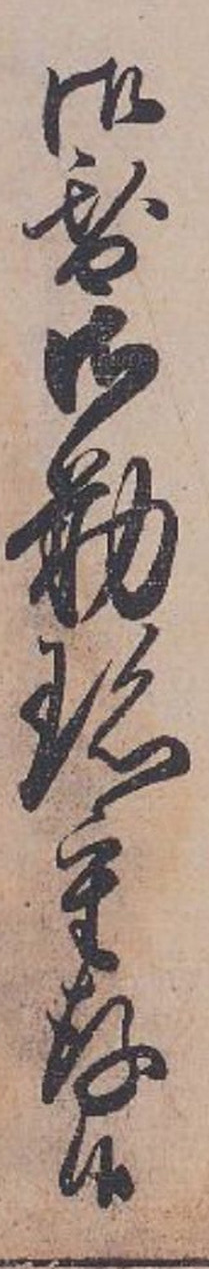御替御勤珍重存候

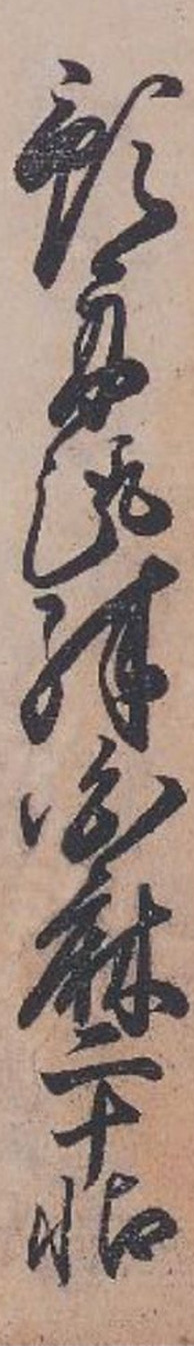預示趣殊白麻二十帖
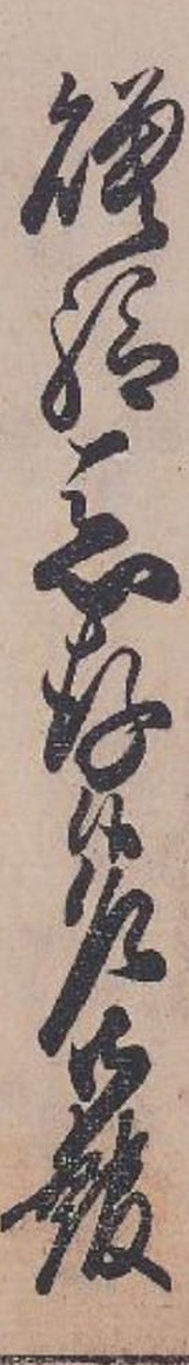贈給忝存候乍御報
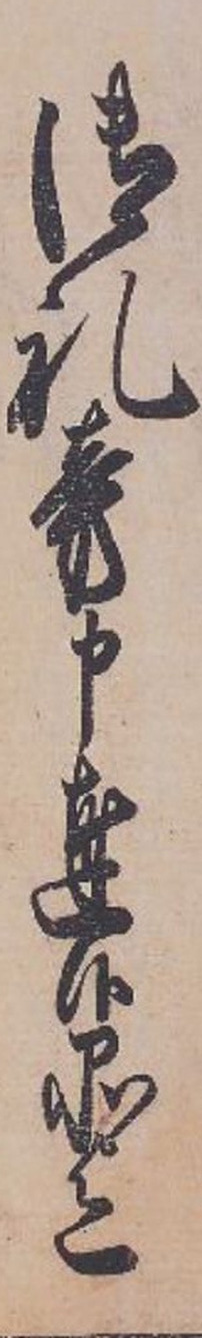御礼旁申達候品迄
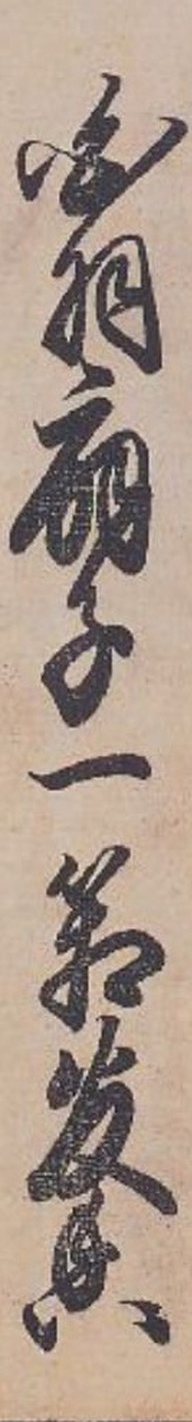白羽扇子一箱官香
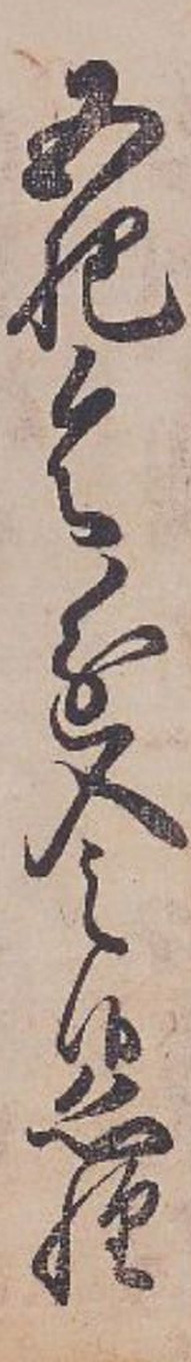五把令進入之候恐惶
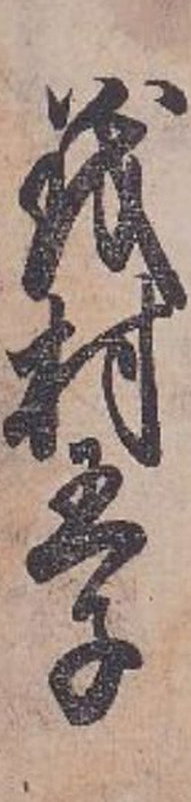茂村王子
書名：琉球談
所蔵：University of the Ryukyus Library
